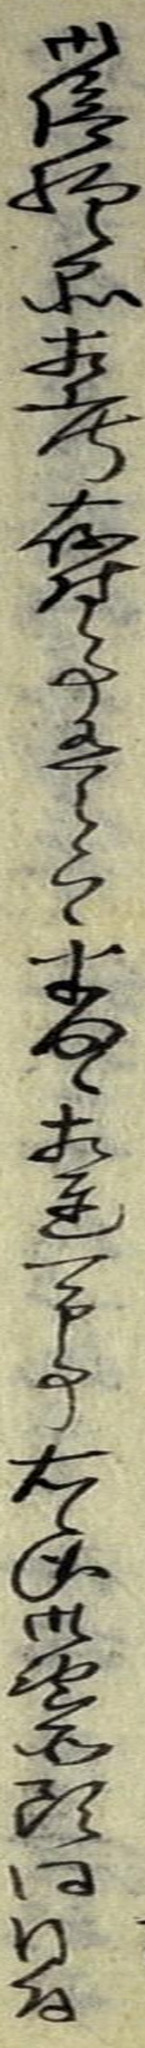御倹約之品相考存付候事有之候ハヽ半右衛門へ相達可申事右之趣御台所頭同目付
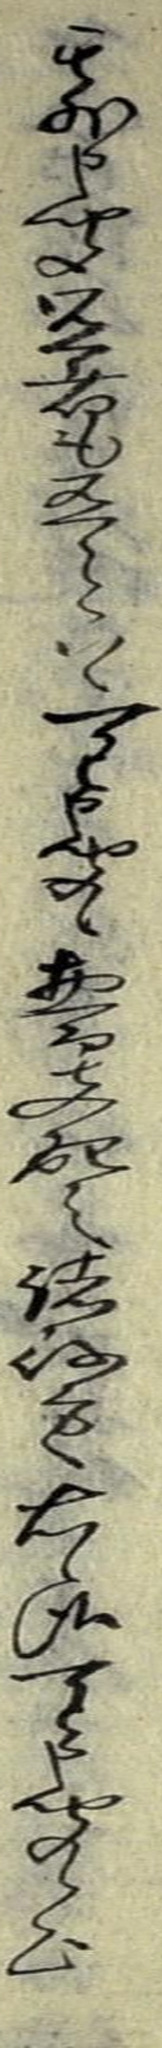其外申聞宜者も有之候ハヽ可被申聞候惣而支配之諸役方へ右之趣可被申聞候以上
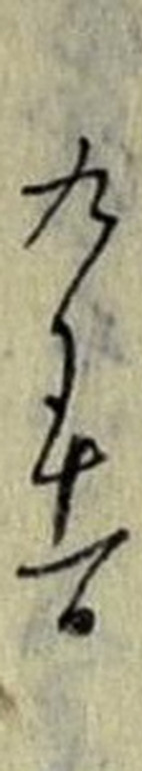九月十一日
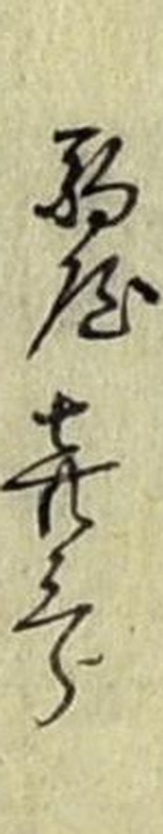駒屋喜三郎
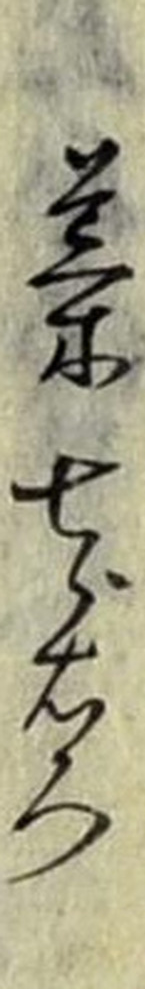荒木七郎右衛門
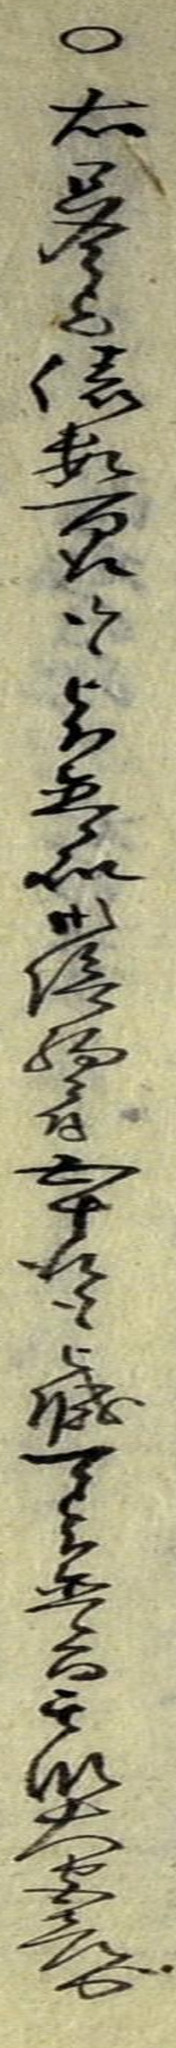〇右只今迄俵数百俵ツヽ被下置候処御倹約ニ付五十俵ツヽ被減可被下置候間其段大宮彦右衛門
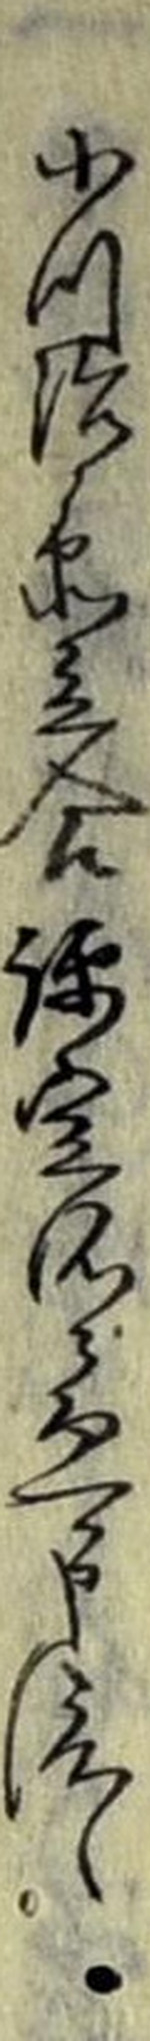小川治兵衛立合評定所ニ而可申渡候
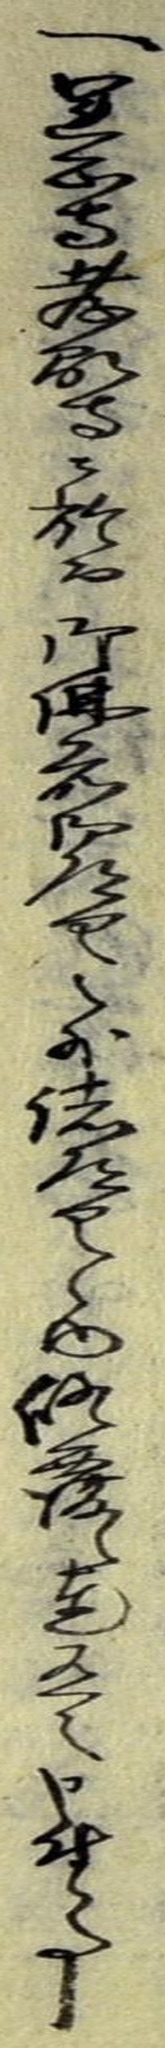一運正寺孝顕寺ニ於而御仏前御道具之外諸道具之内修覆之達有之申付候事

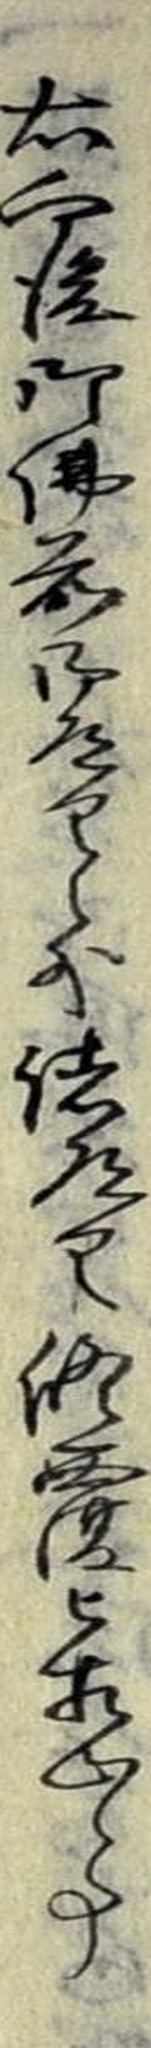右向御仏前御道具之外諸道具修覆被相止候事
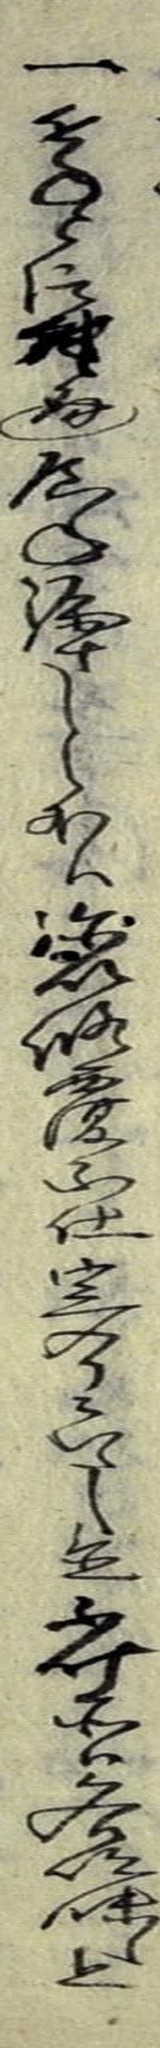一近年被仰付候通やね漏さし外ハ弥以修覆不仕定〆りニいたし置不叶所ハ吟味之上
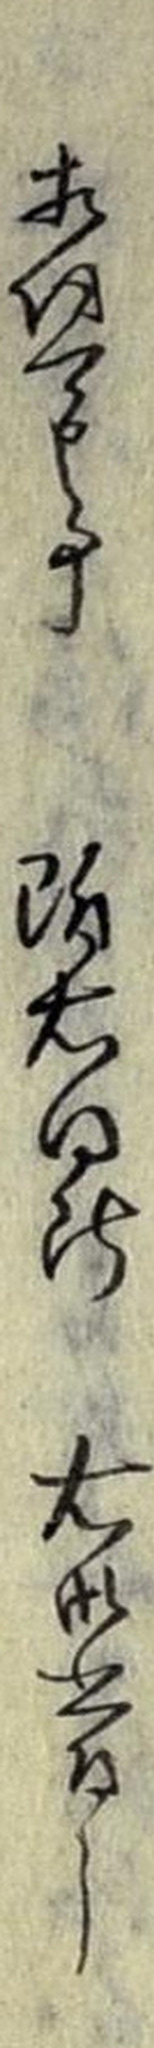相伺可申事附右同断右御書付之
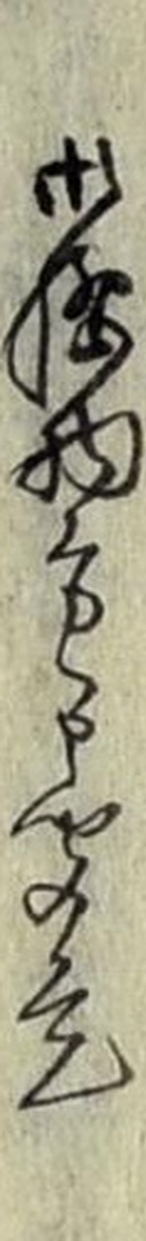御腰物方へ申聞覚
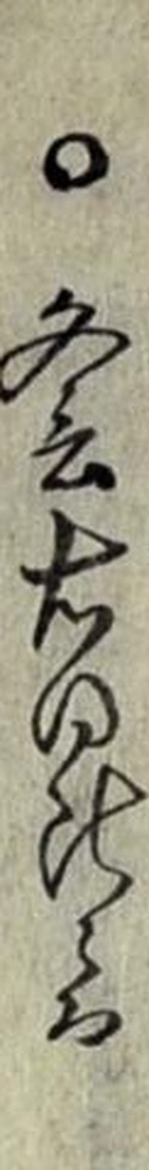〇文言右同断ニ而
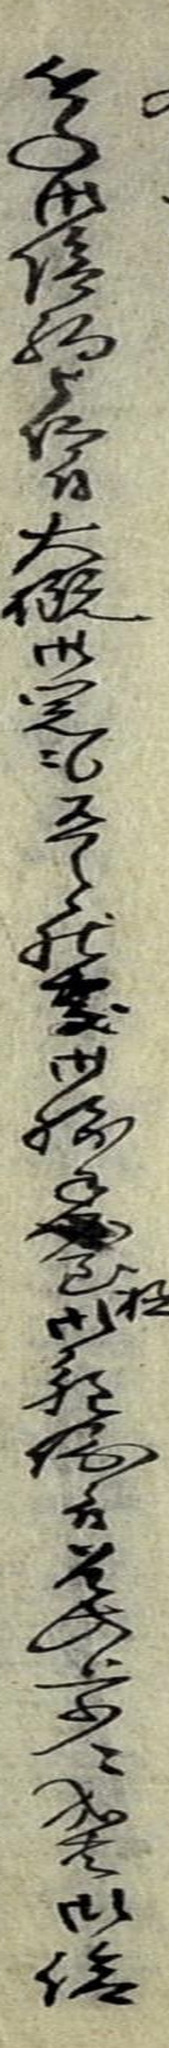近年御倹約被仰付大概御定も有之候然処御勝手至極御難儀ニ付乍此上少々成共御倹
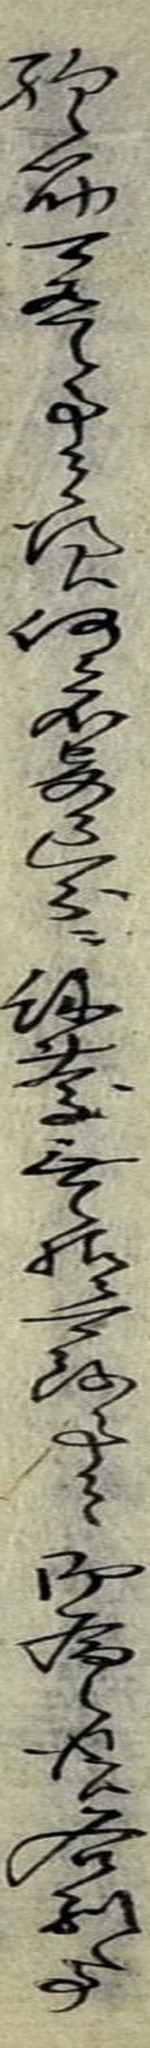約之筋可有之事ニ候得ハ何ニ不寄過分ニ余慶無之様ニ可致事ニ候御為之儀ハ各別之事
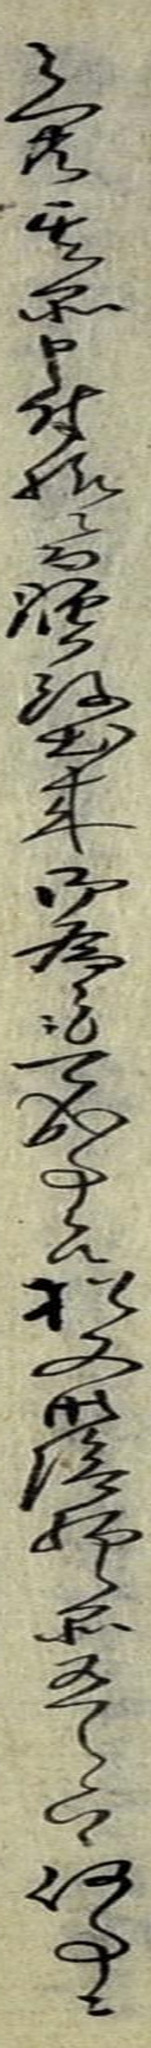ニ候へ共其品申付様ニ而軽ク致出来御為ニも可成事ニ候猶又御倹約之品有之候ハヽ何事ニ
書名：命令之部 一
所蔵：福井県文書館 Fukui Prefectural Archives
